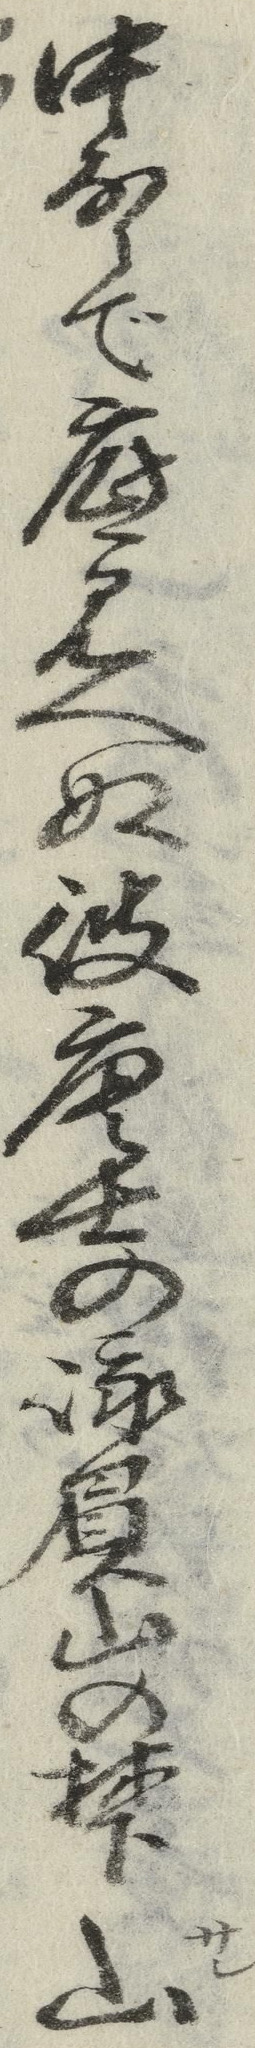中ならで底見へぬ彼唐士の峨眉山の梺山
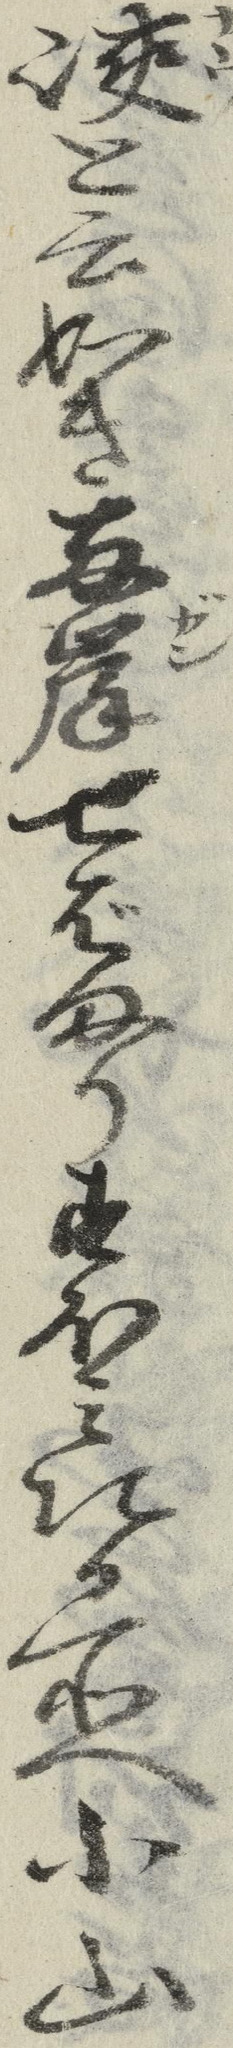峡と云如き両岸せばまりすほみたる所へ小山
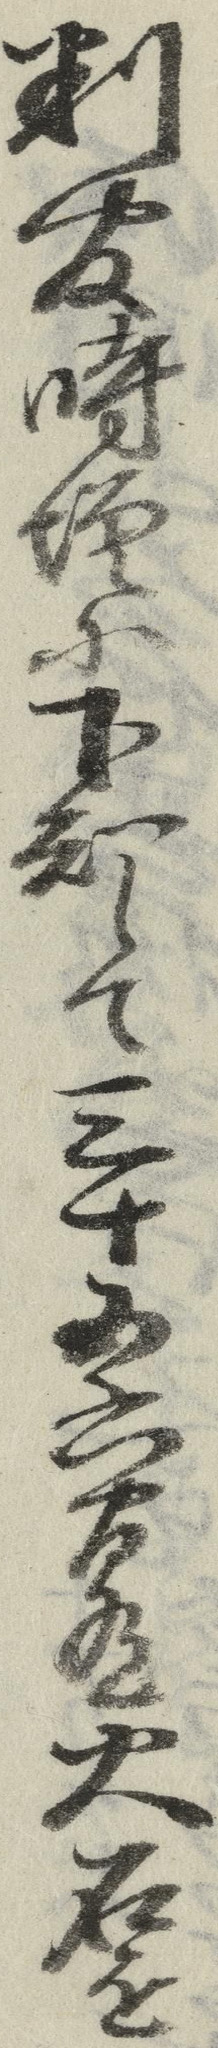判官時浄に下知して三十五六間有火石を
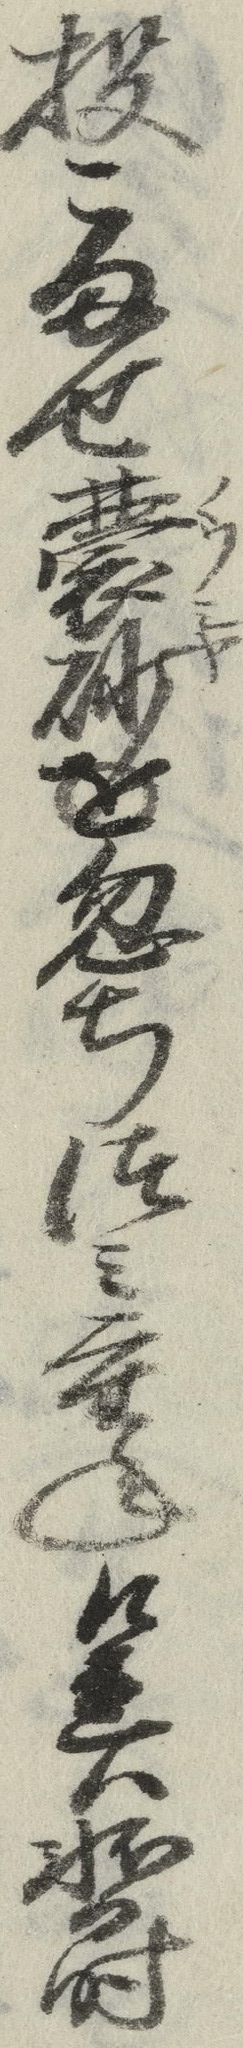投こませ農砂を忽ちつみ重ねけれは暫時
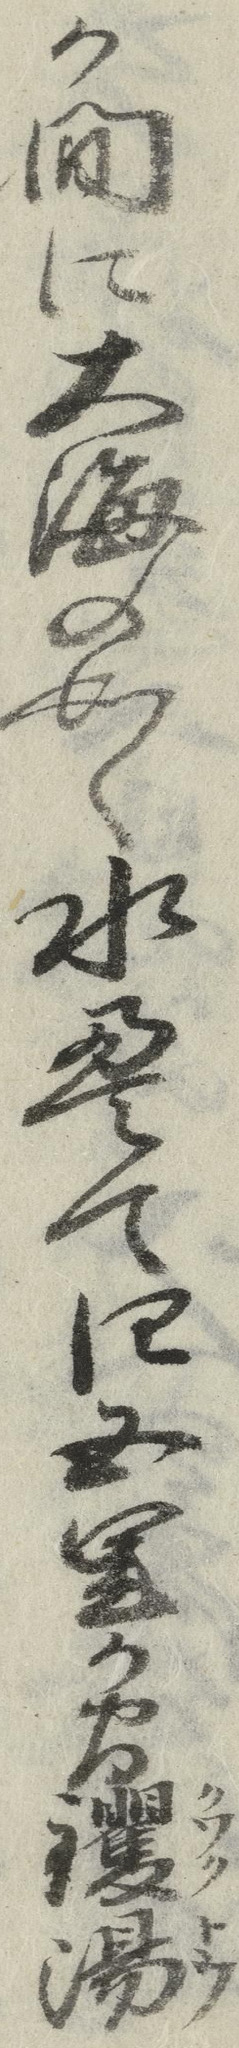か間に大海の如く水畳て四五里か間钁湯
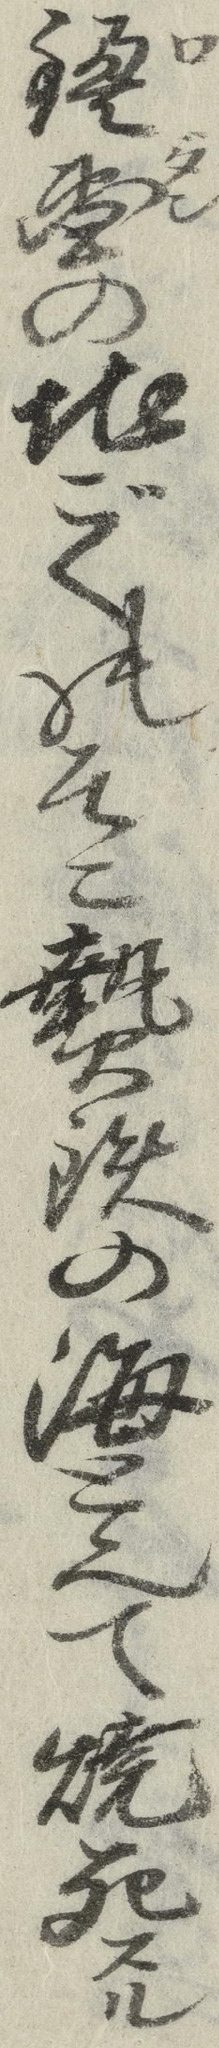纑堂の地ごくのそこ熱鉄の海と也て焼死スル
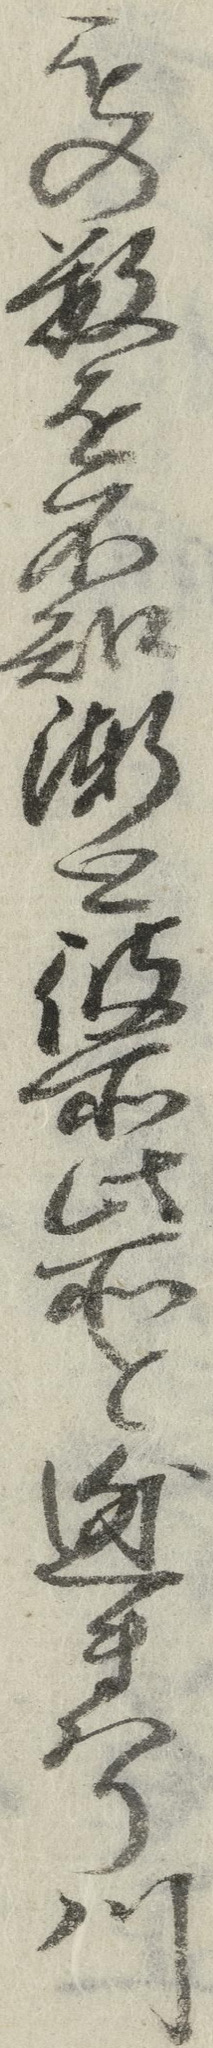もの数を不知漸と彼所此所と迯まはり川
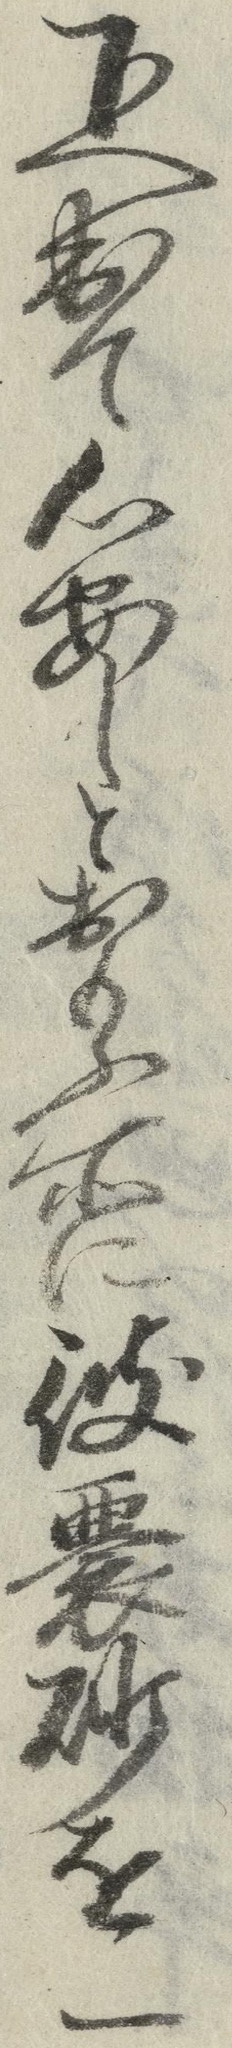下へ出て心安しとおりふ所に彼農砂を一
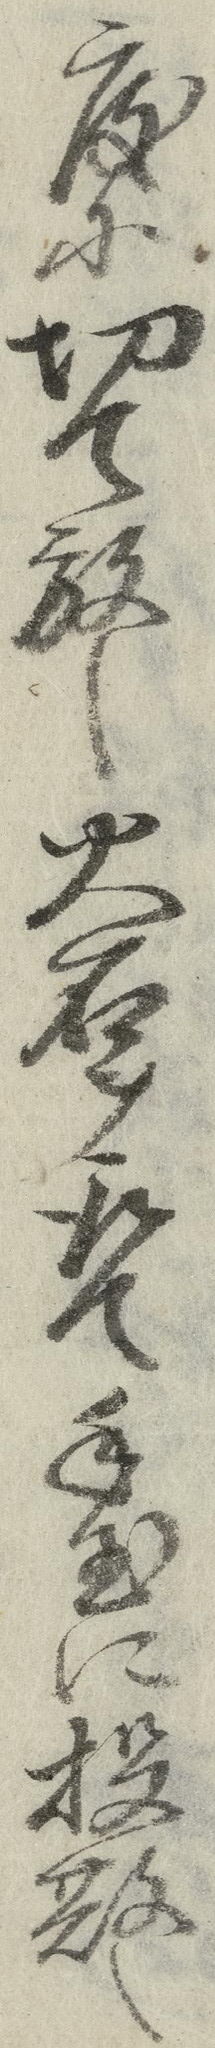度に切て放し火石ヲ取て手玉に投散し
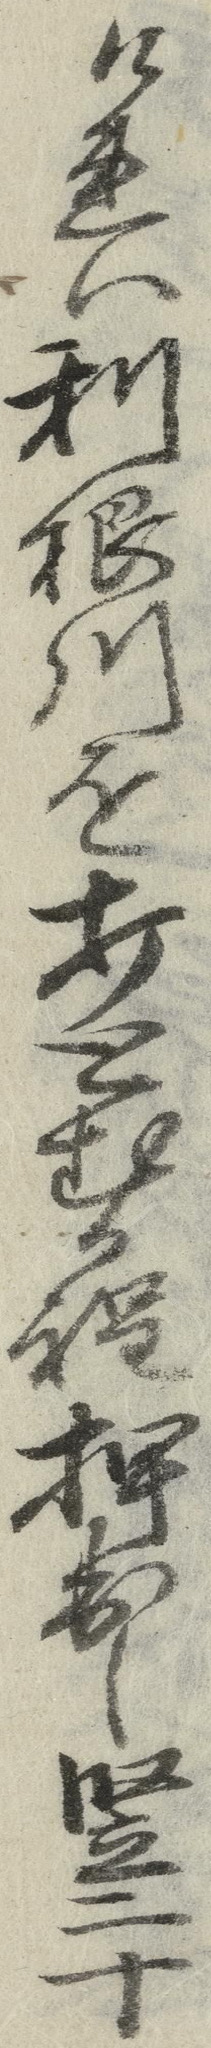けれは利根川を打とむる程押出し竪二十

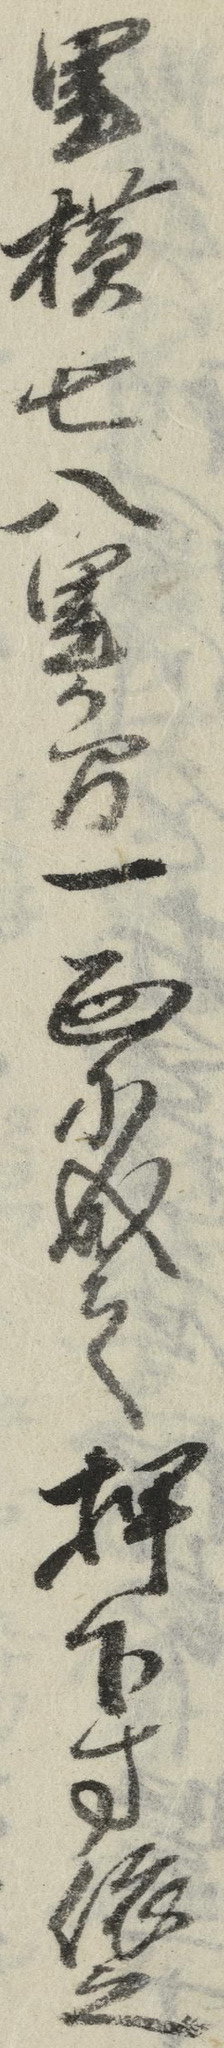里横七八里の間一面に成て押下す依之
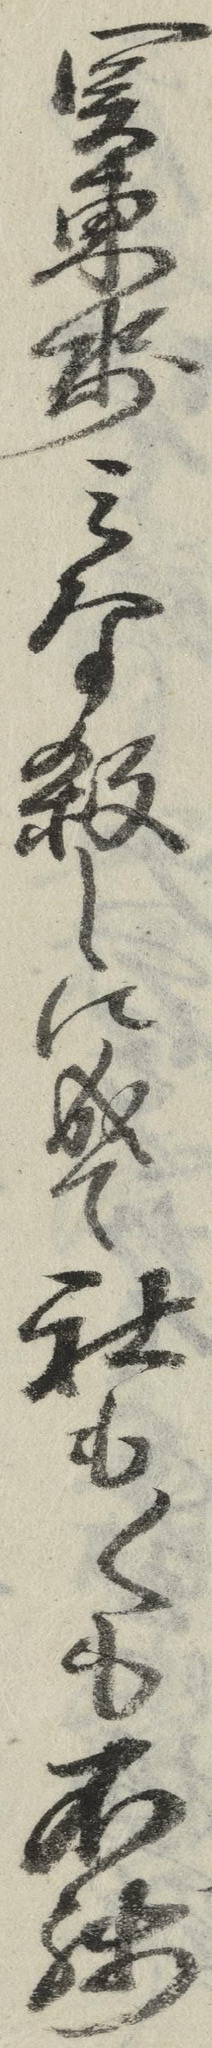関東勢みな殺しに成て社もくも不残
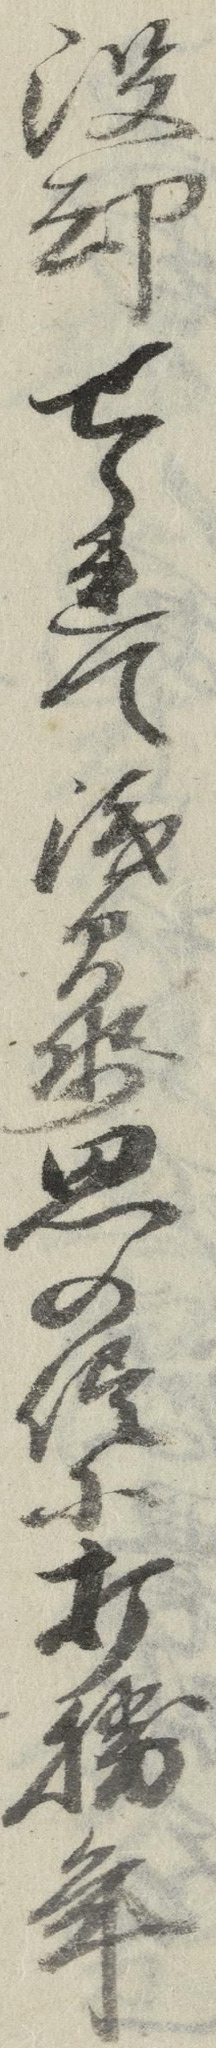没却せられて浅間勢思の侭に打勝年
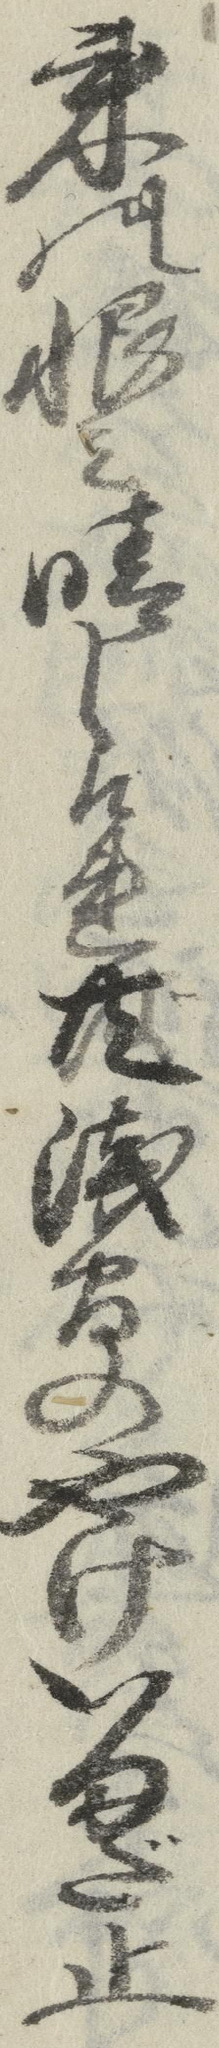来の恨を晴しけれ共浅間のやけいまだ止
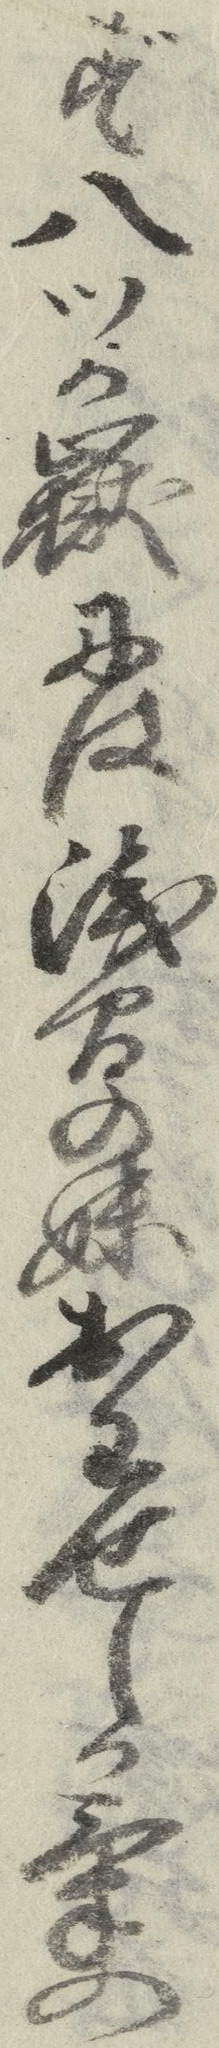ず八ツか嶽には浅間の妹おわせしか気の
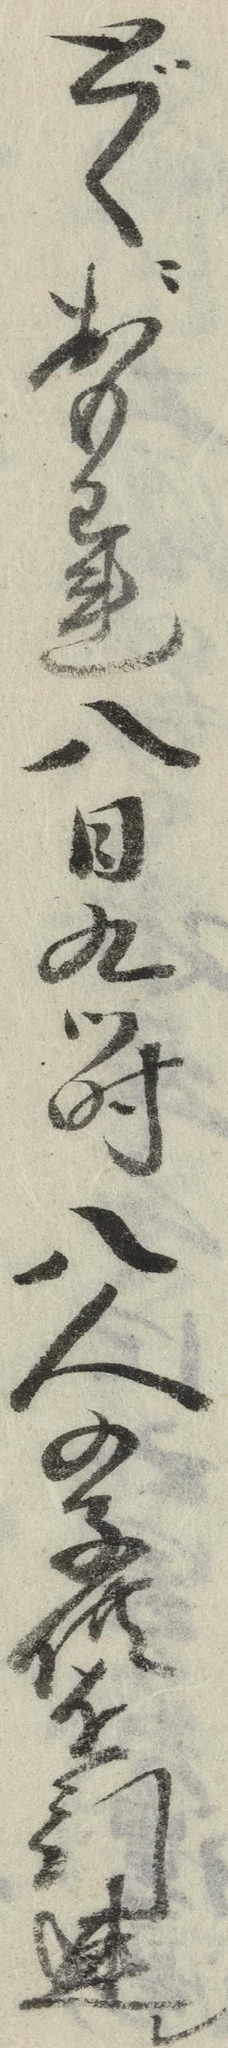どくにおもわれ八日九ツ時八人の子供を引連レ
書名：浅間大焼騒動記　上
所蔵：東京大学地震研究所図書室 Earthquake Research Institute Library, The University of Tokyo, JAPAN
